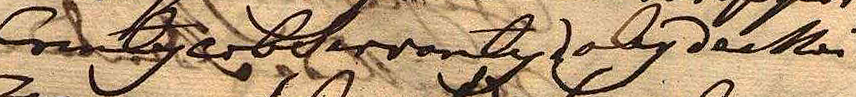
Crentes e observantes da Ley de Moi
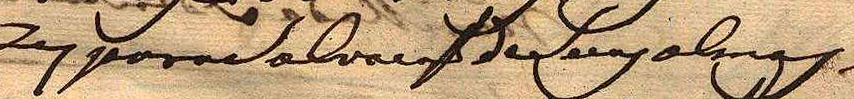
zes para salvaçaõ de suas almas.
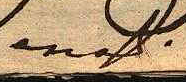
e naõ.
